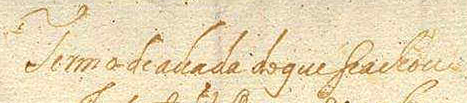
Termo de achada do que se achou
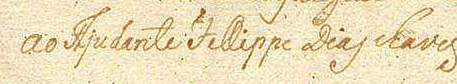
ao Ajudante Fellippe Dias chaves
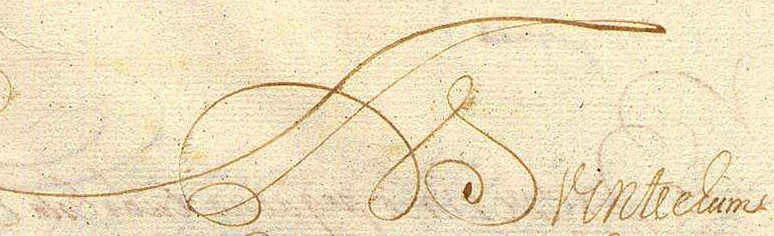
AOS vinte e hum
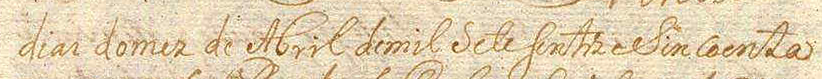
dias do mez de Abril de mil Setesentos e Sincoenta
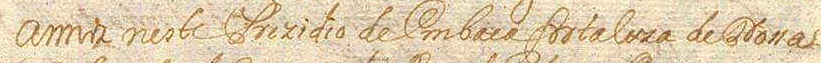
annos neste Prezidio de Embaca fortaleza de Nossa
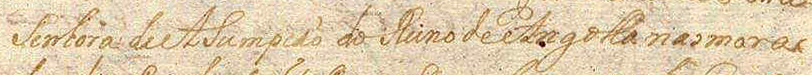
Senhora de ASumpçaõ do Reino de Angolla nas moras
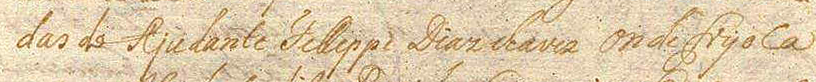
das do Ajudante Fellippe Diaz chavez onde foy o Ca
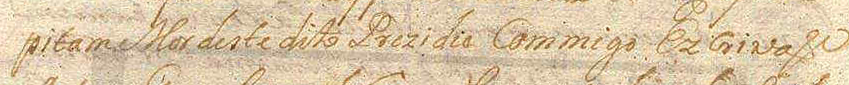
pitam Mor deste dito Prezidio Commigo Ezcrivaõ
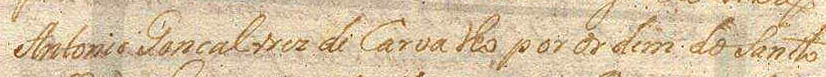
Antonio Gonçalvrez de Carvalho por ordem do Sancto
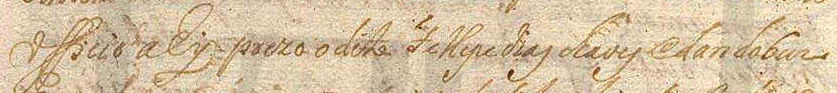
officio ahy prezo o ditto Fellipe dias chaves e dando buz
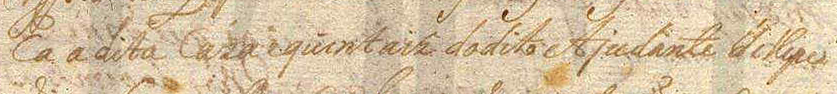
Ca a dita Caza e quintaiz do dito Ajudante Fellipe
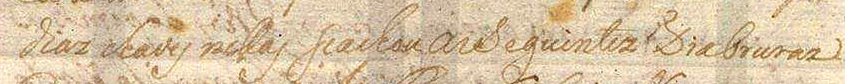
diaz chaves nellas se achou as Seguintez Diabruraz
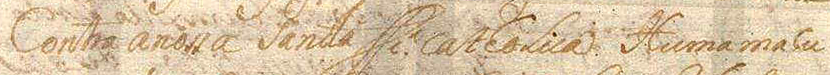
Contra a nossa Santa fe catholica. Huma macu
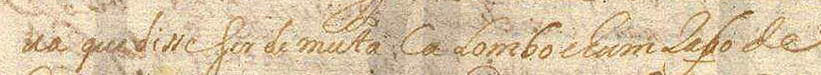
ca que disse ser de muta CaLombo e hum Rabo de
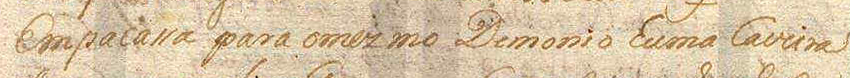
Empacassa para o mezmo Demonio huma Caveira
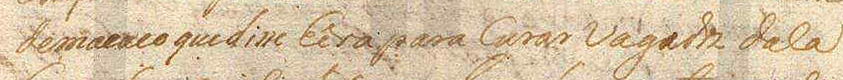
de macaco que disse héra para Curar vagadoz da Ca
